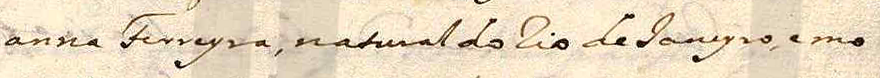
anna Ferreyra, natural do Rio de Ianeyro, e mo
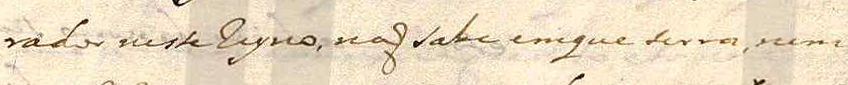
rador neste Reyno, naõ sabe em que terra, nem
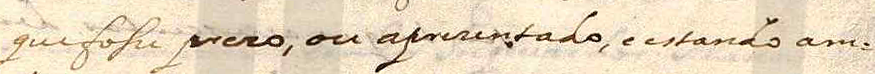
que fosse prezo, ou aprezentado, e estando am
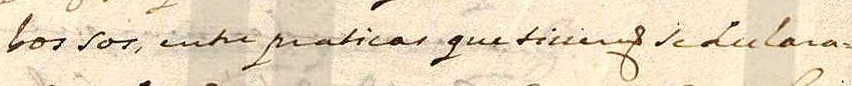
bos sos, entre praticas que tiueraõ se declara
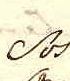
sos
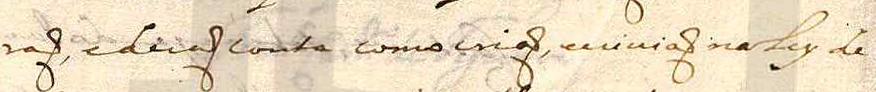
raõ, e deraõ conta como criaõ, e uiuiaõ na Ley de
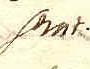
prat.
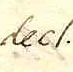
decl.
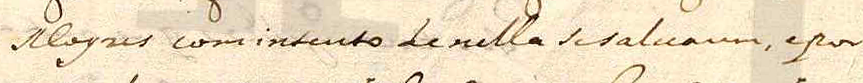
Moyzes com intento de nella se saluarem, e por
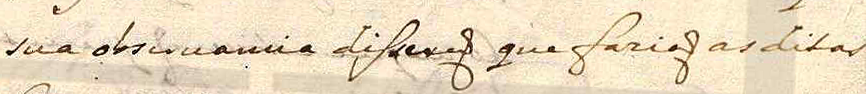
sua obseruancia disseraõ que faziaõ as ditas
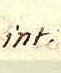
int.
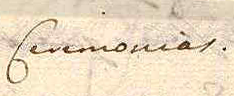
Ceremonias.
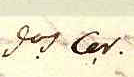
d.as cer.
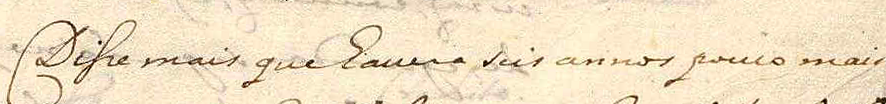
Disse mais que hauera seis annos pouco mais
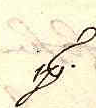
tp̄.
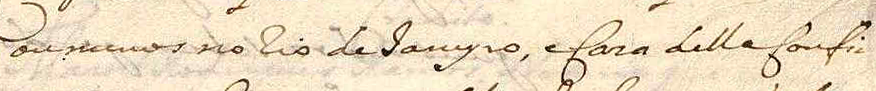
ou menos no Rio de Iaueyro, e Caza della Confi
